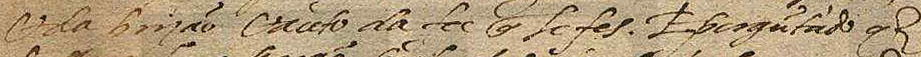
& da prizaõ & auto da fee q̄ se fes. E pergūtado q̄
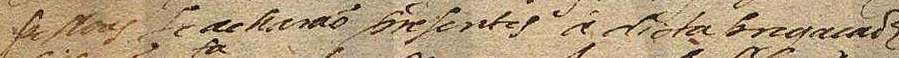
pessoas se acharaõ presentes a dicta pregaçaõ
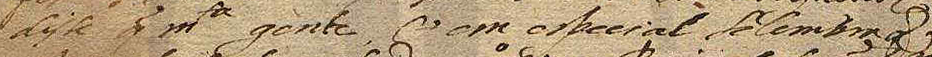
disse q̄ mta gente, & em especial se lembra q̄
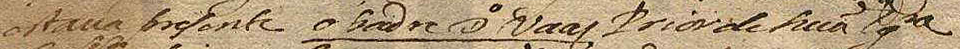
estaua presente o padre Do Vaaz Prior de huā Igra
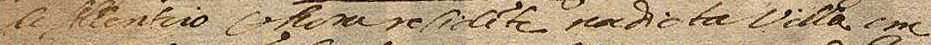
de Alenteio & hora residēte na dicta villa em
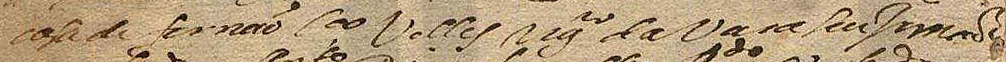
casa de fernaõ lço Velles Vigro da Vara seu Jrmaõ
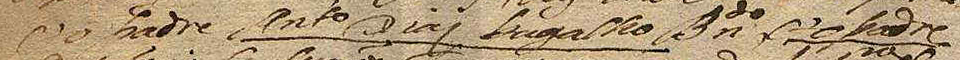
& o Padre Anto Diaz bugalho Bndo & o padre
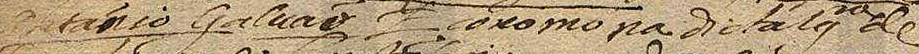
Anton̄io Galuaõ Economo na dicta lgra de
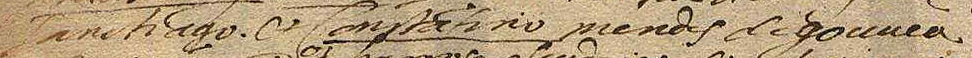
Sanctiago & Constātino mendes de gouuea
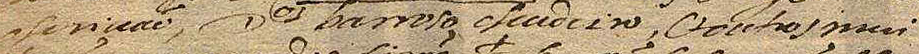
escriuaõ, Dos barroso escudeiro, & outros mui
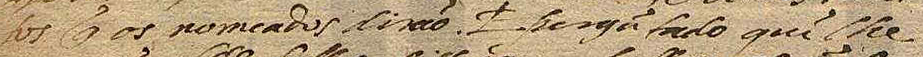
tos q̄ os nomeados diraõ. E pergūtado quē lhe
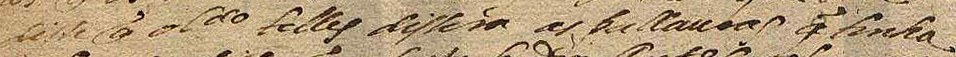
disse cō o ldo telles dissera as pallauras q̄ tinha
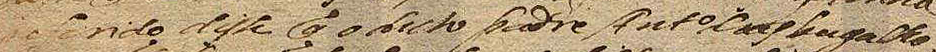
referido disse q̄ o dicto padre Anto dias bugalho,
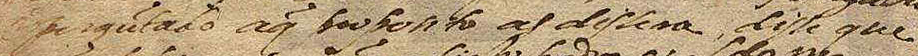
& pergutado o q̄ proposito as dissera, disse que
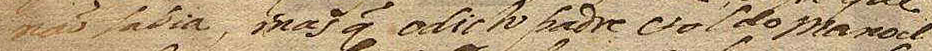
naõ sabia, mas q̄ o dicto padre & o ldo manoel
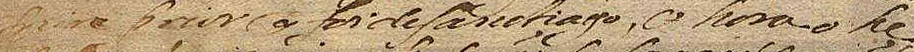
freire prior q̄ foi de sanctiago, & hora o he
